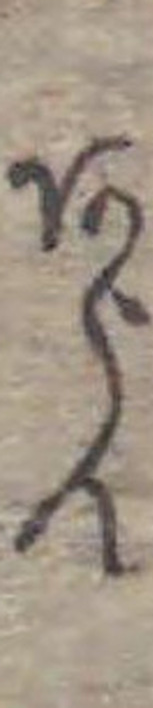あらん
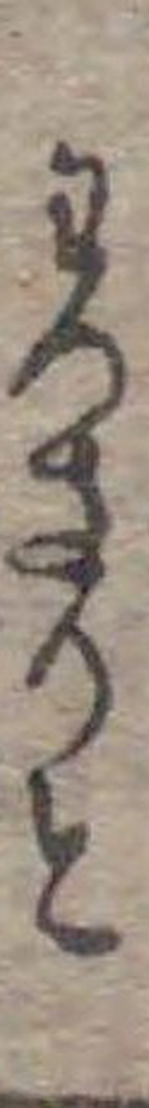わつさりと
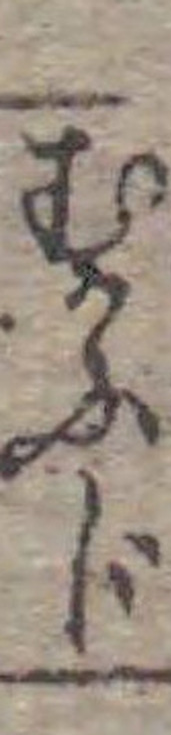むかふじ
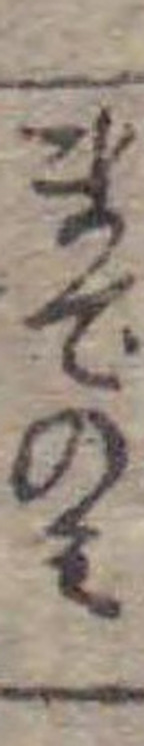までのみ
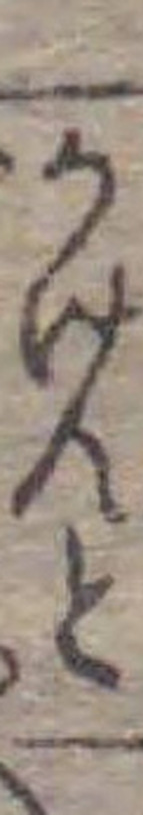かけんと
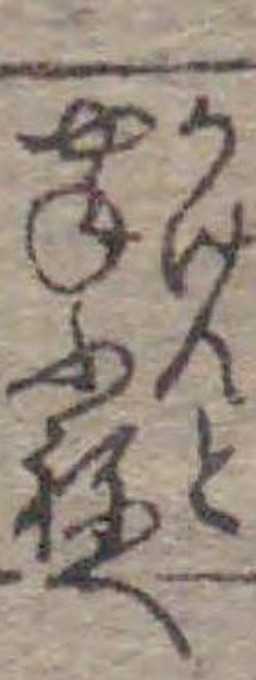やねふねへ
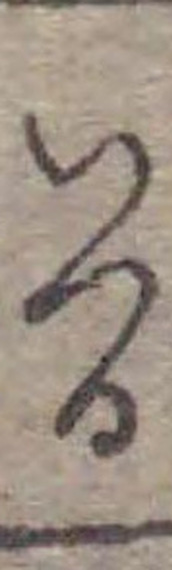いつる
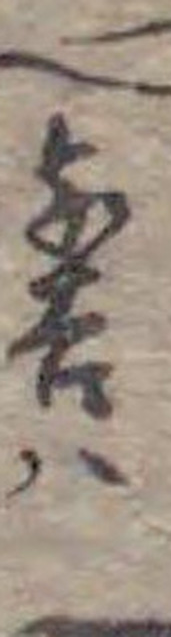与吉は
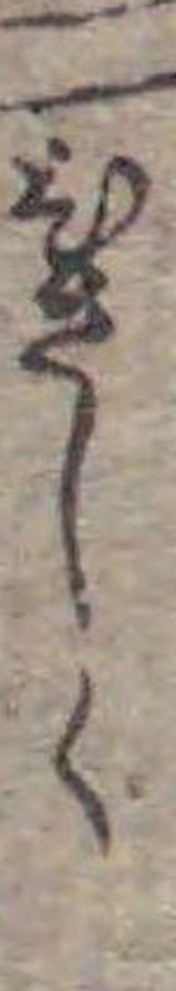ひさしく
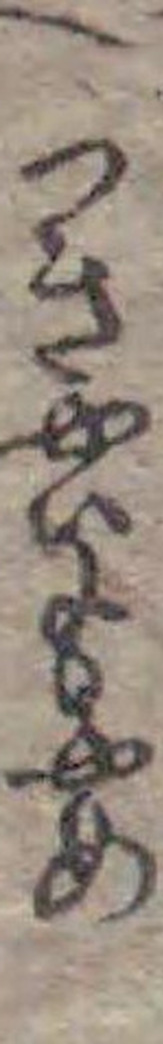つきやいもやめ
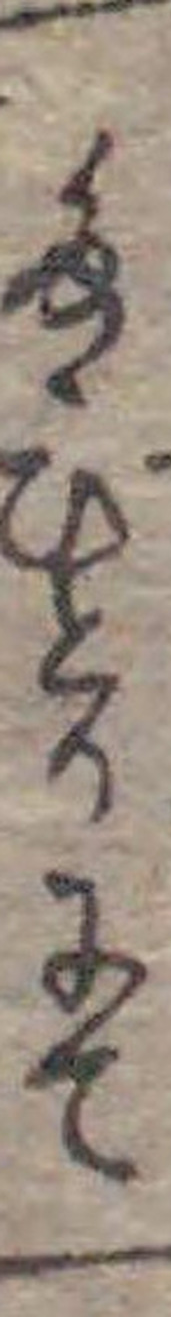たゝひとりにて
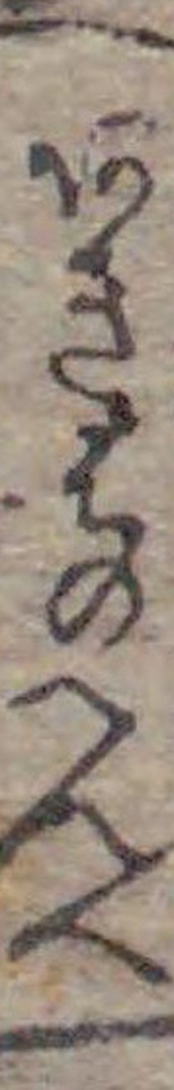あきはのへんへ
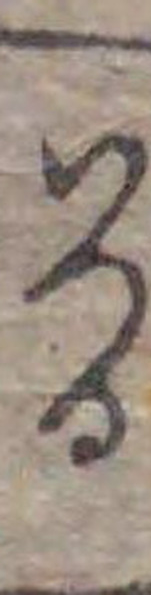いつる

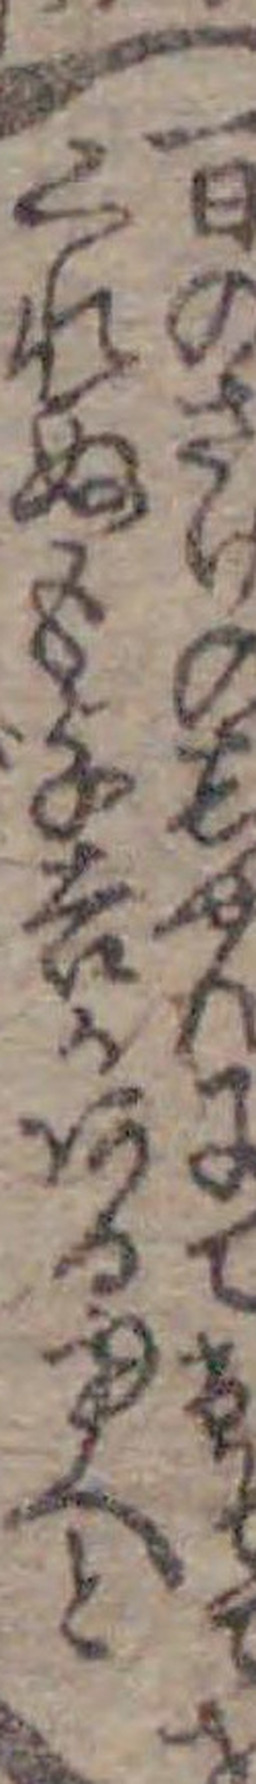くれぬも与吉かあるゆへと
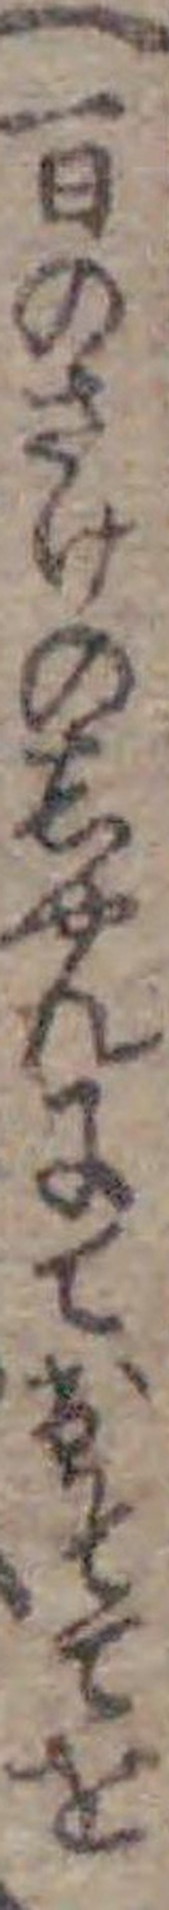一日のさけのしやんにておそてを
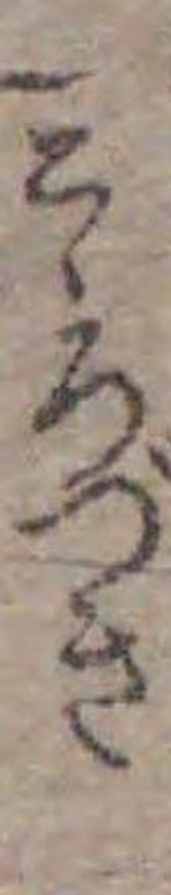こゝろづき
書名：神田与吉一代記 : 3巻
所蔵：国立国会図書館 National Diet Library, JAPAN
